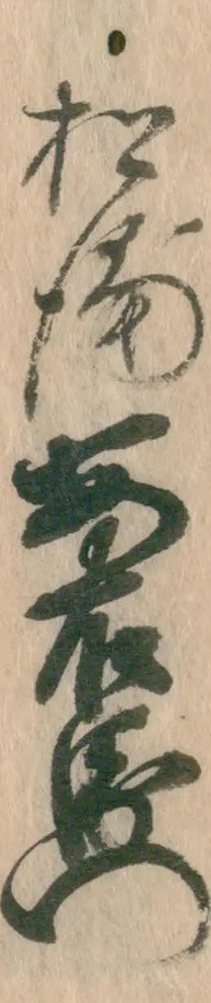松浦安右衛門
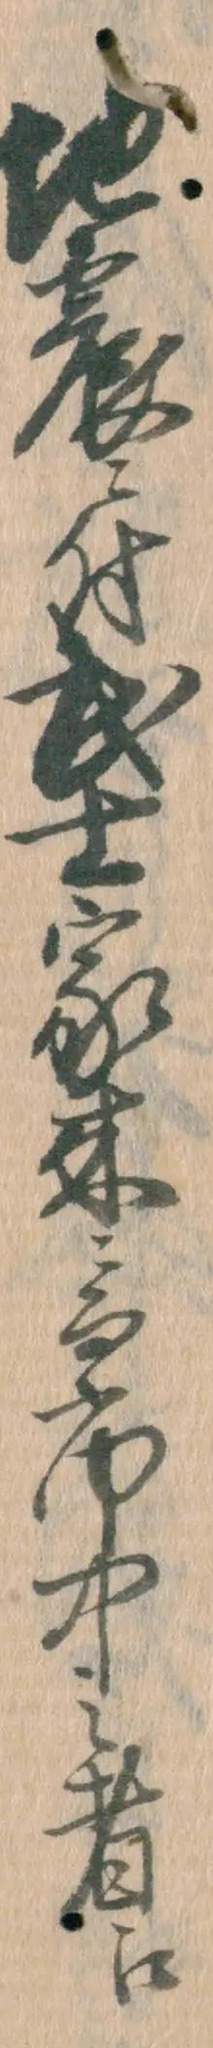地震ニ付武士家来ニ而市中之者え
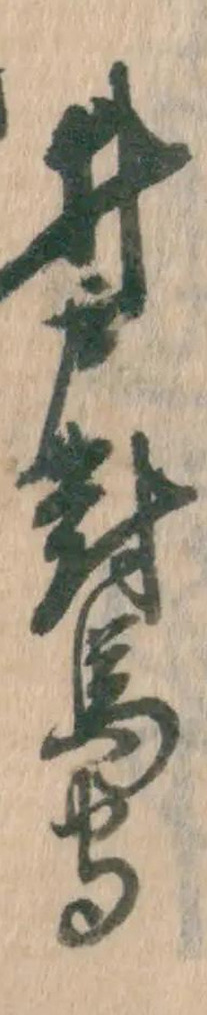井戸対馬守
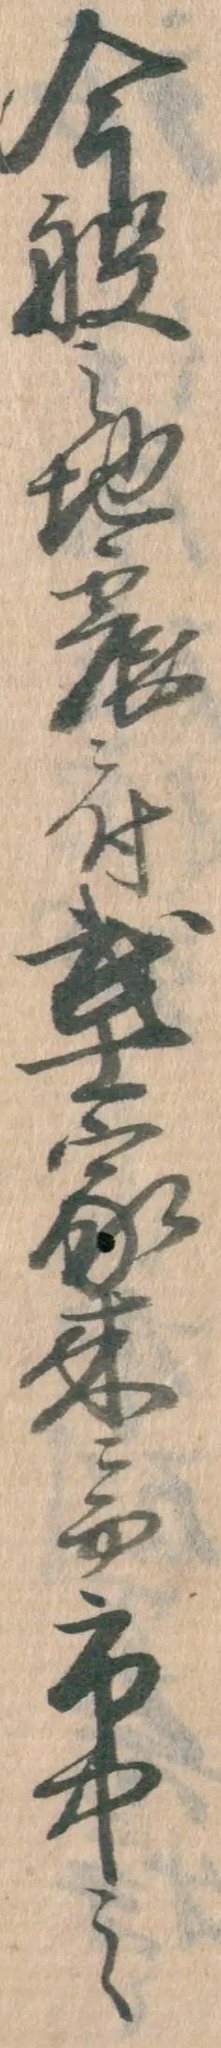今般之地震ニ付武士家来ニ而市中之
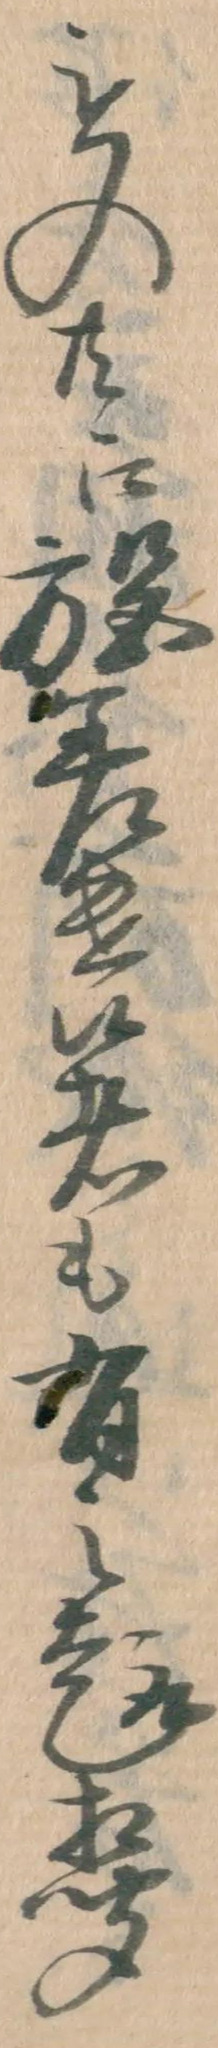もの共え施差遣候者も有之趣相聞

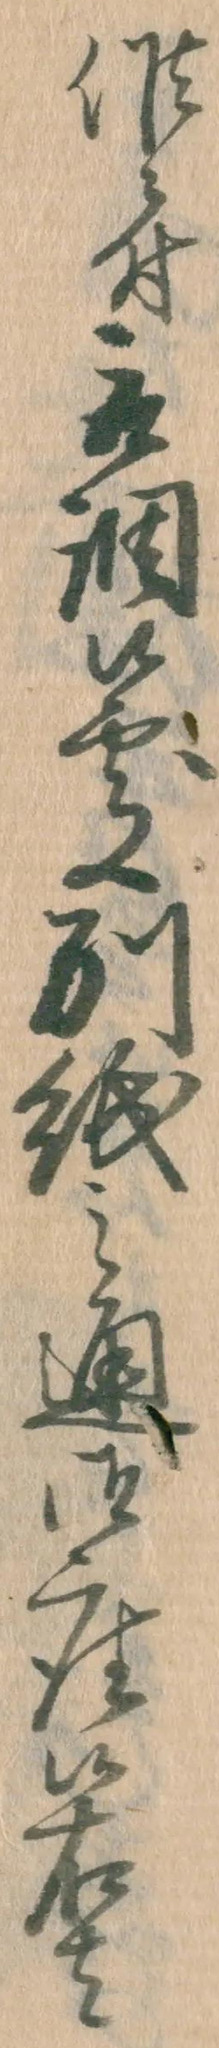候ニ付取調候処別紙之通御座候右は
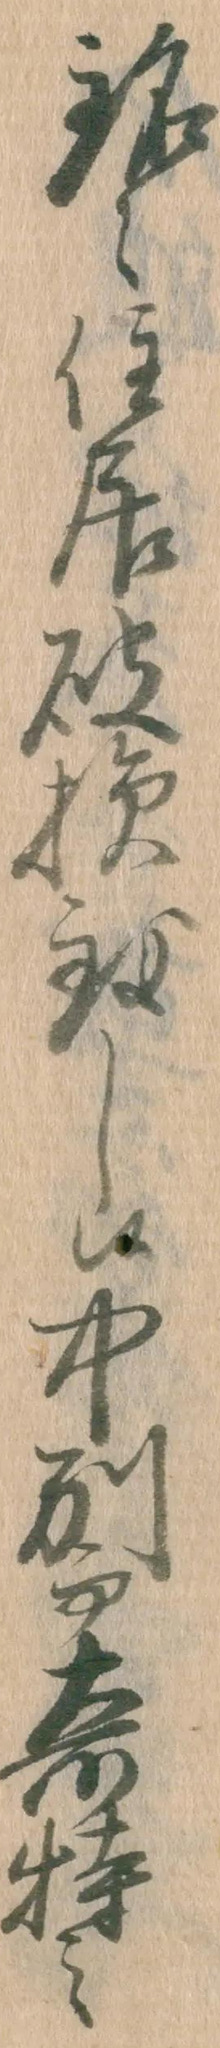銘々住居破損致し候中別而奇特之
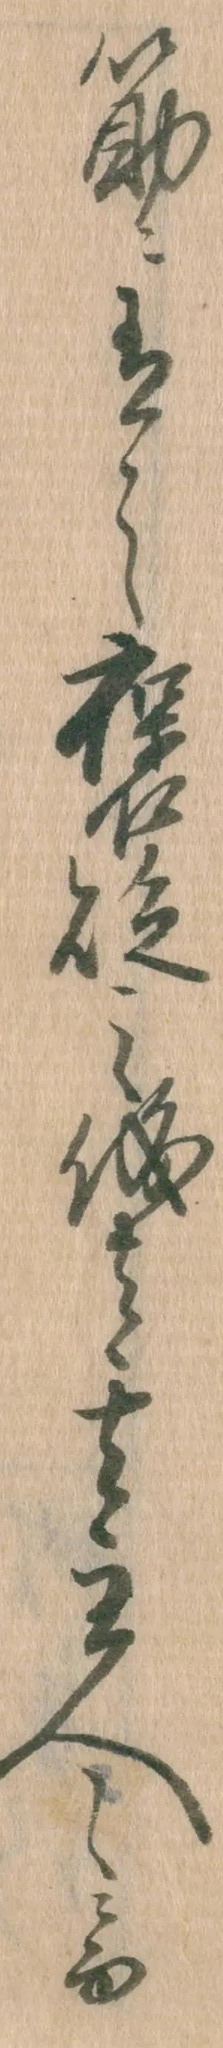筋ニ有之褒貶之儀は其主人々ニ而
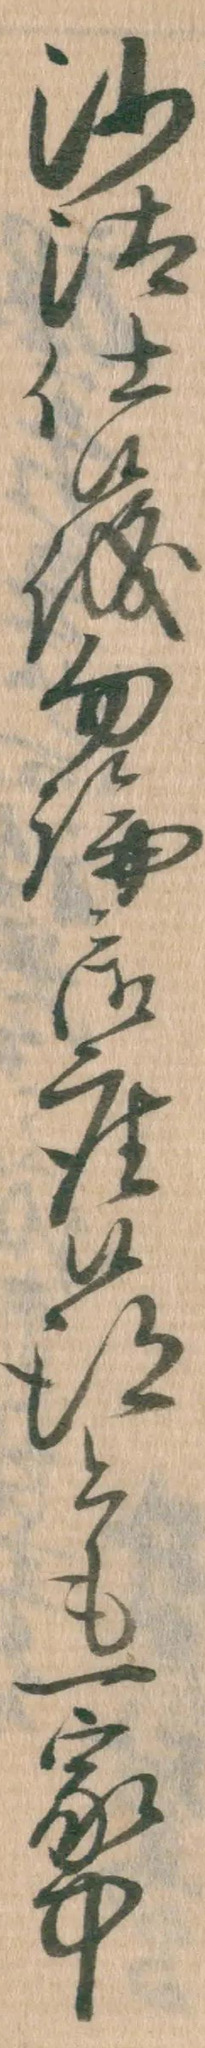沙汰仕候儀勿論ニ御座候得とも一家中
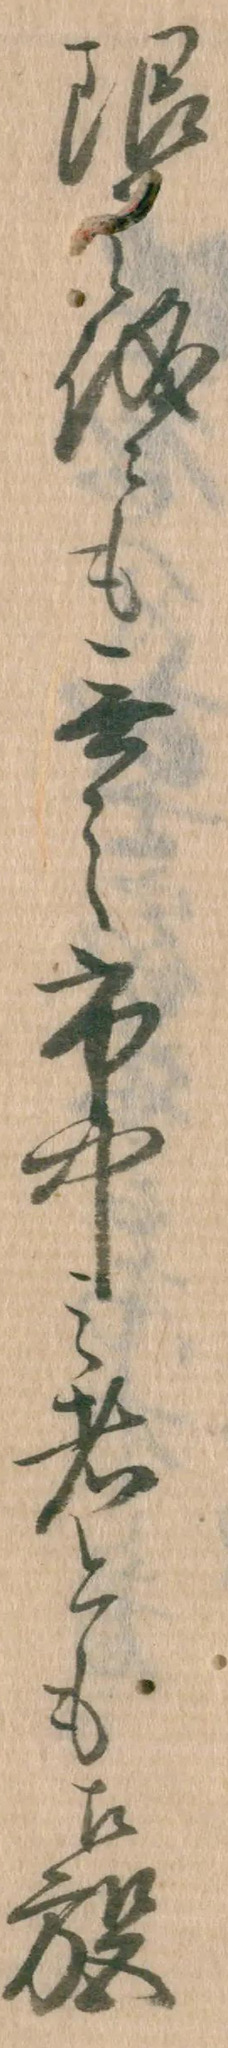限之儀ニも無之市中之者ともえ施
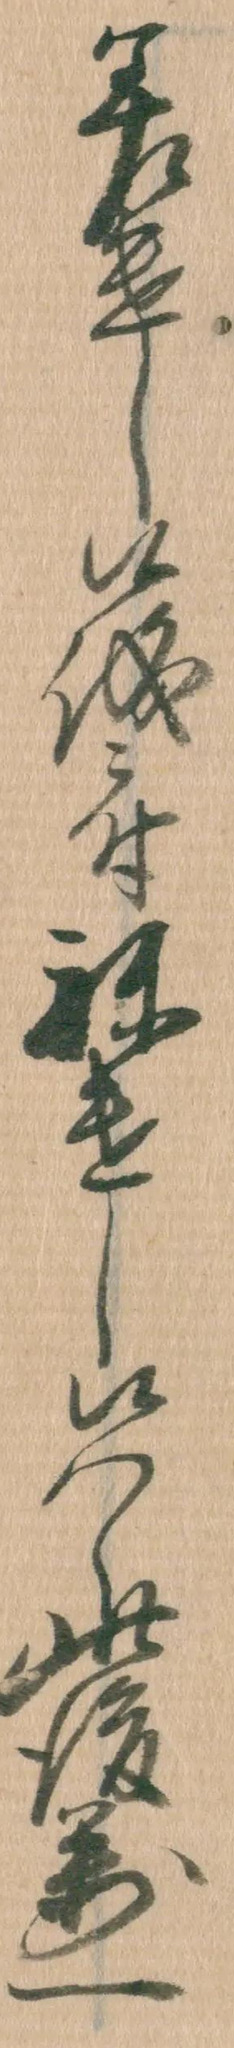差遣し候儀ニ付称遣し候ハヽ此後万一
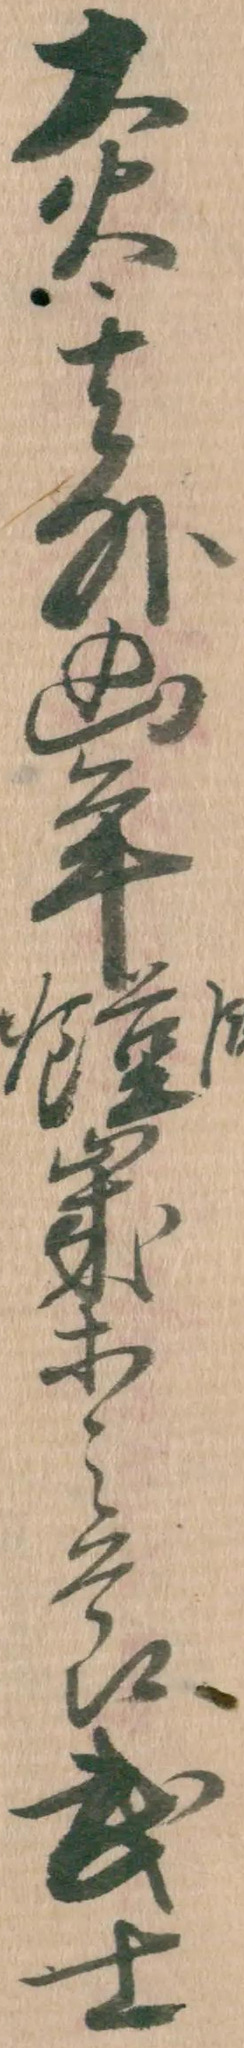大火其外凶年饑饉歳等之節武士
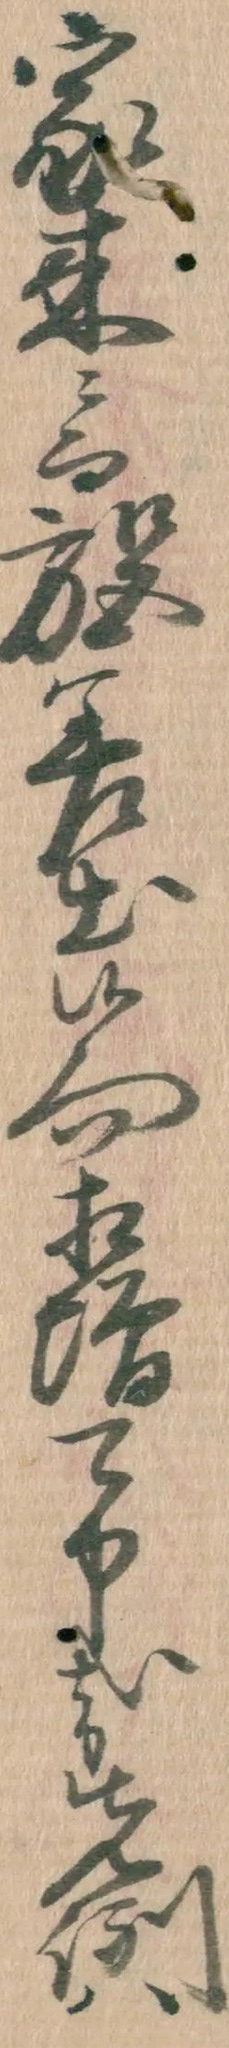家来ニ而施差出候向相増可申哉先例ハ
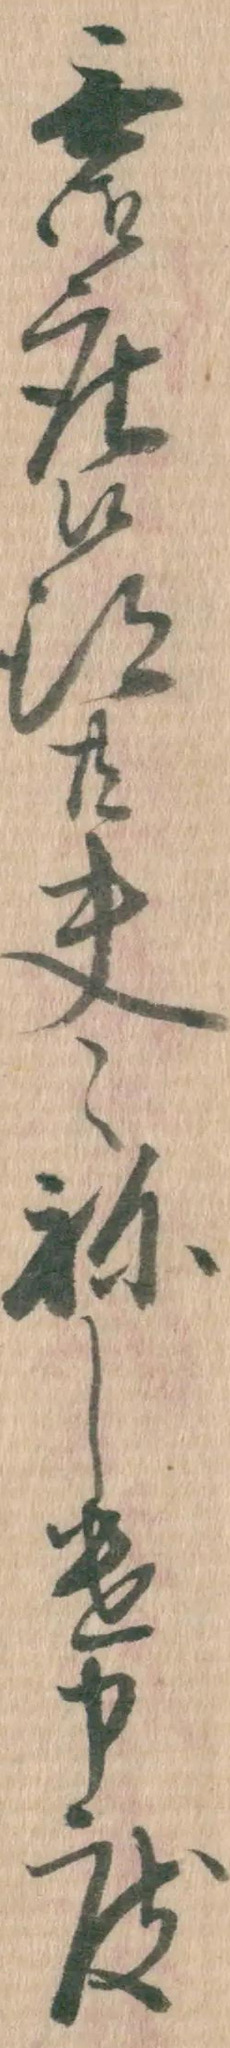無御座候得共夫々称し遣申度

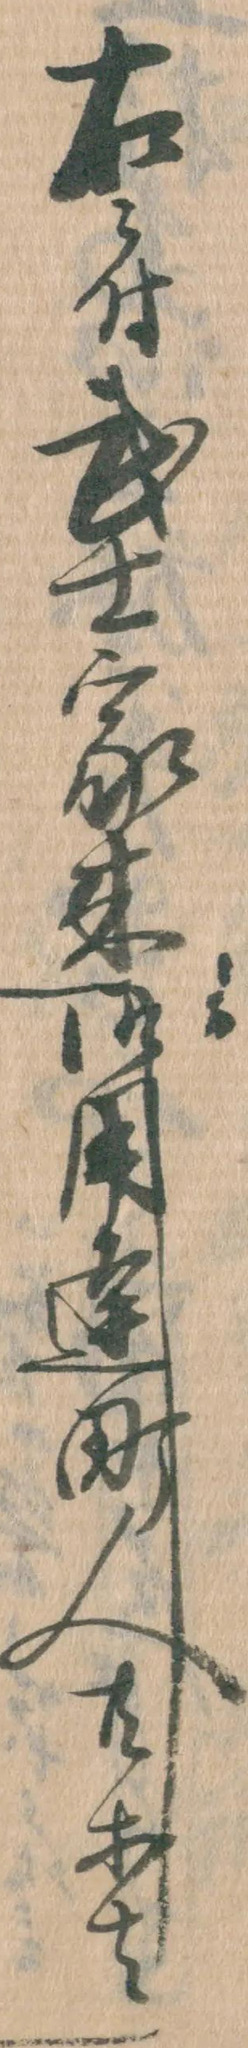右ニ付武士家来「御用達町人共等は
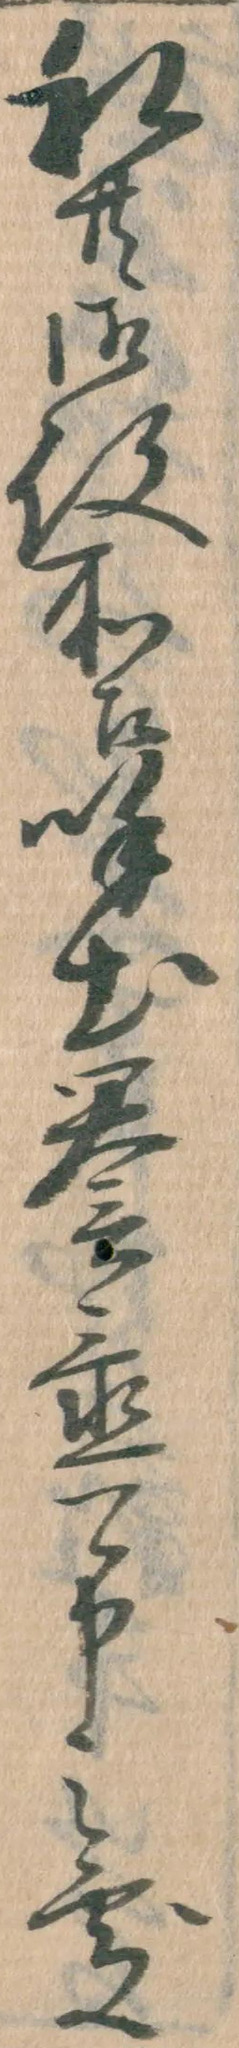私共御役所え呼出誉置可申之処
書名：武家方并寺院等ニテ施差出候一件
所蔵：国立国会図書館 National Diet Library, JAPAN
